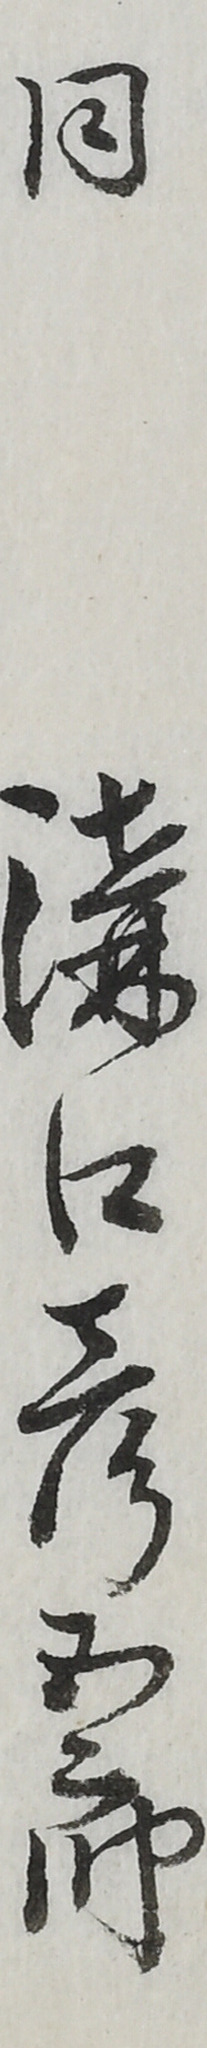同溝口彦五郎
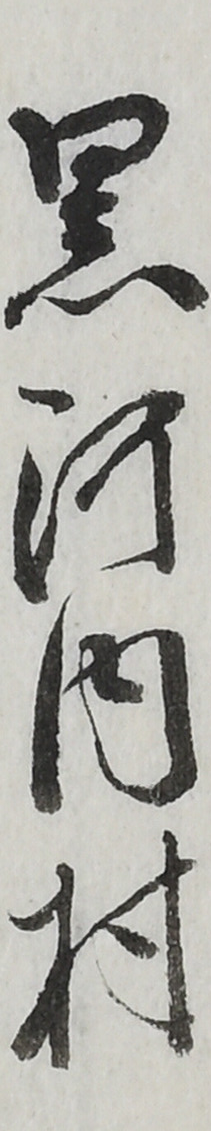黒河内村
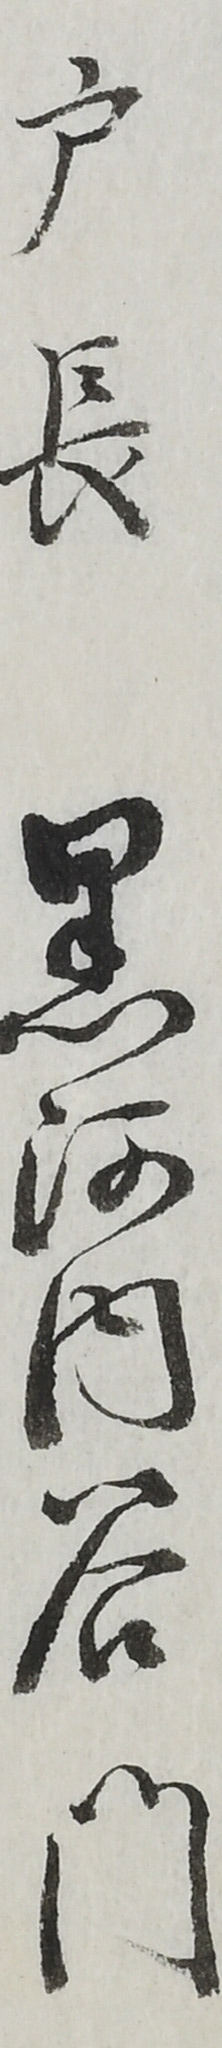戸長黒河内谷門
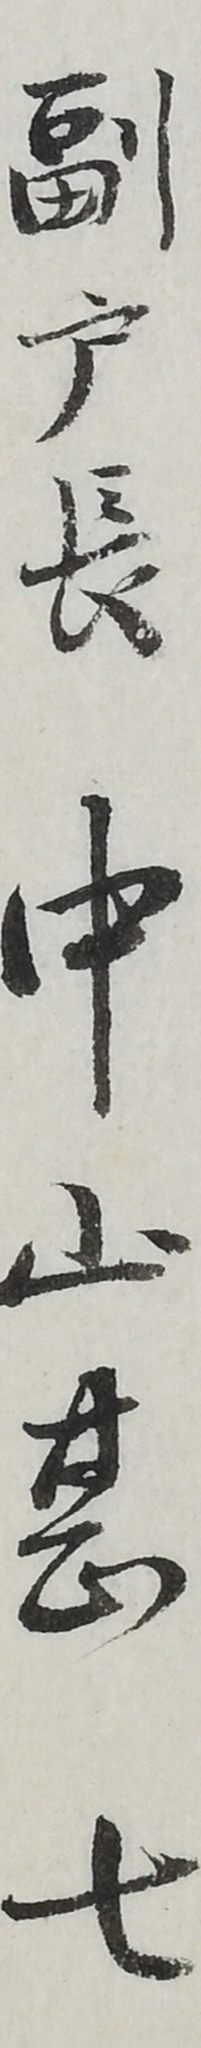副戸長中山甚七

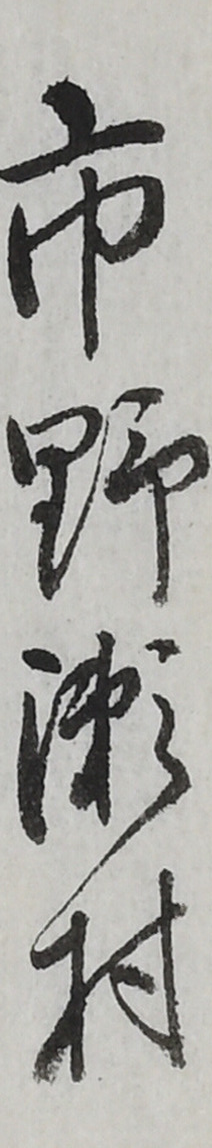市野瀬村
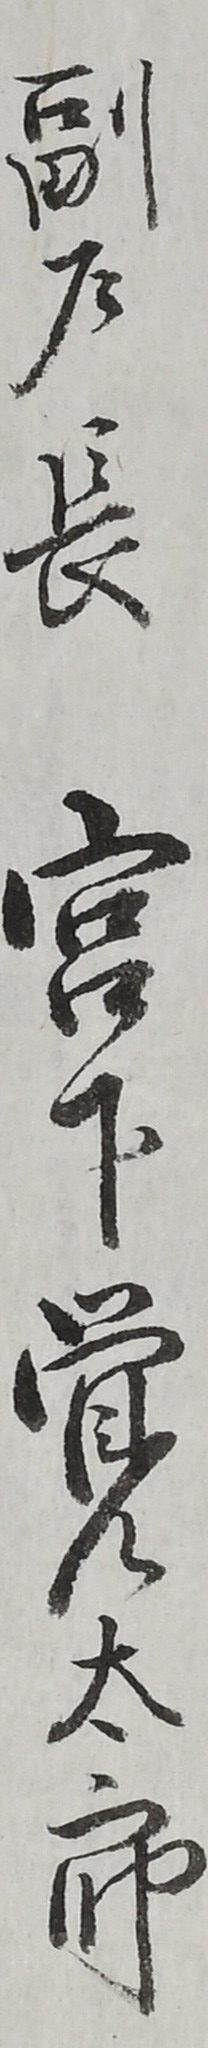副戸長宮下茂平治
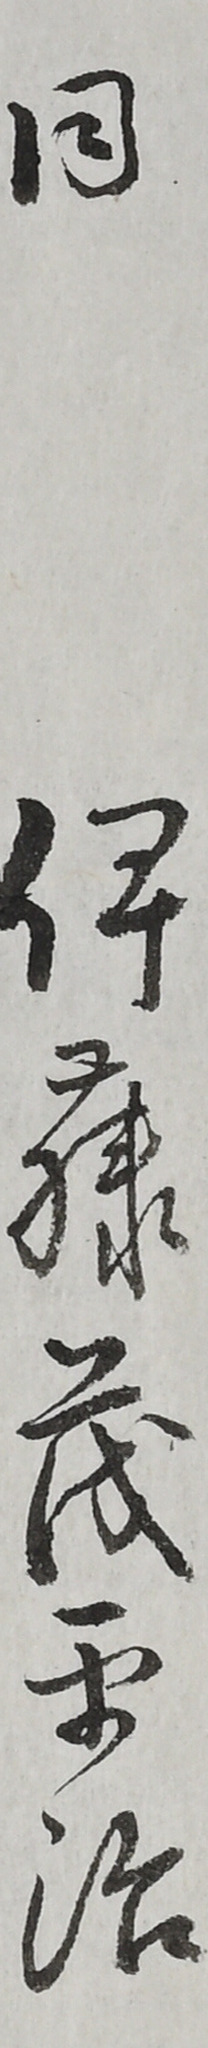同伊藤茂平治
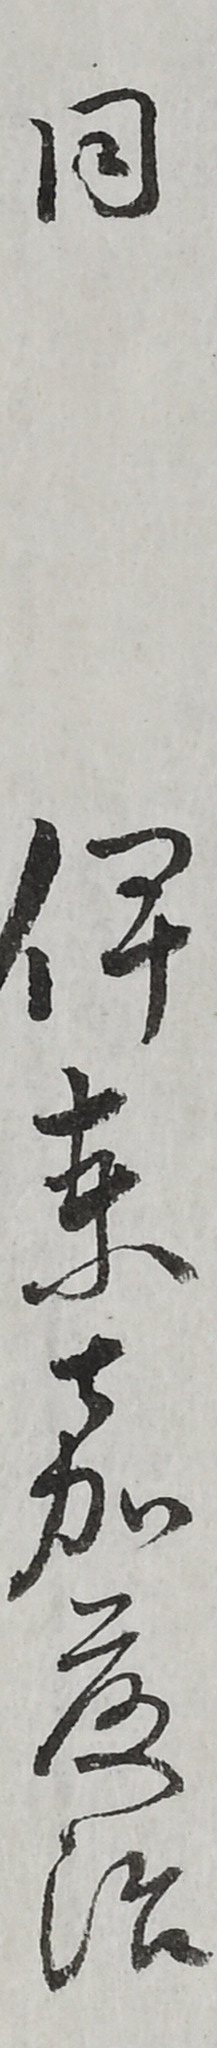同伊東嘉藤治
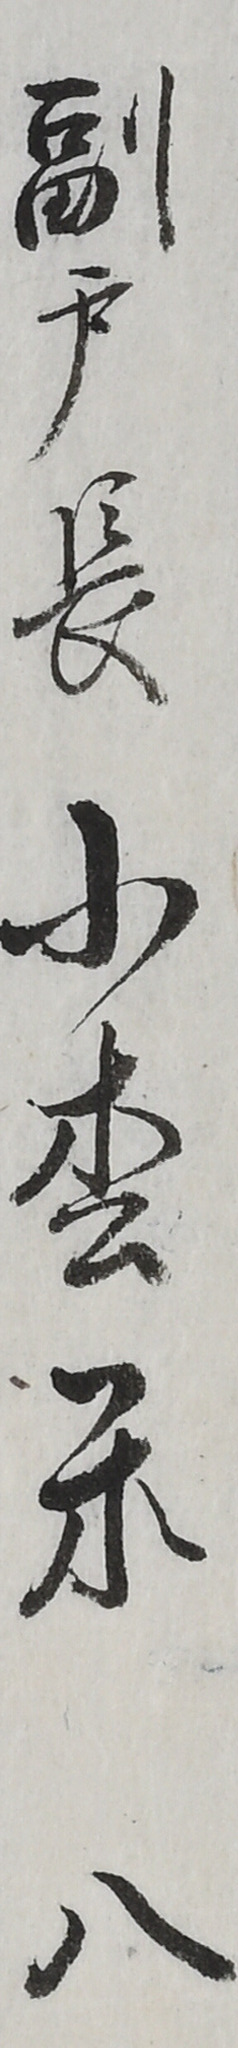副戸長小松米八
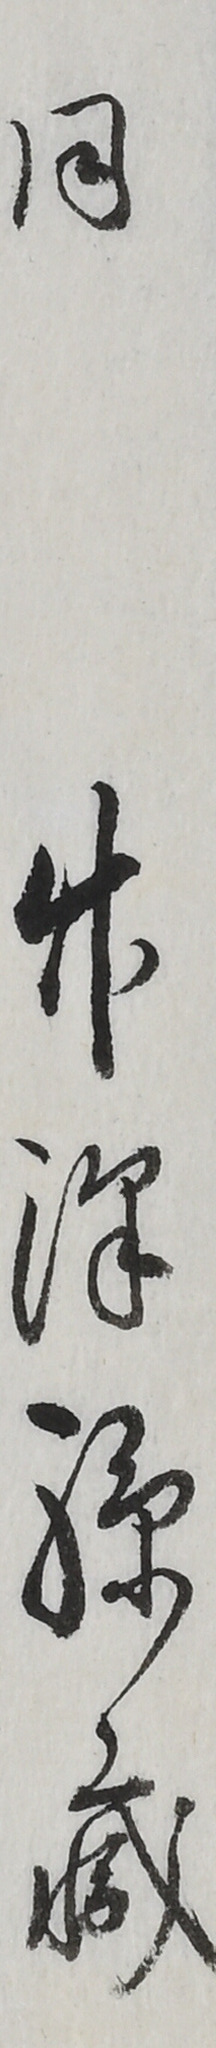同竹澤孫蔵
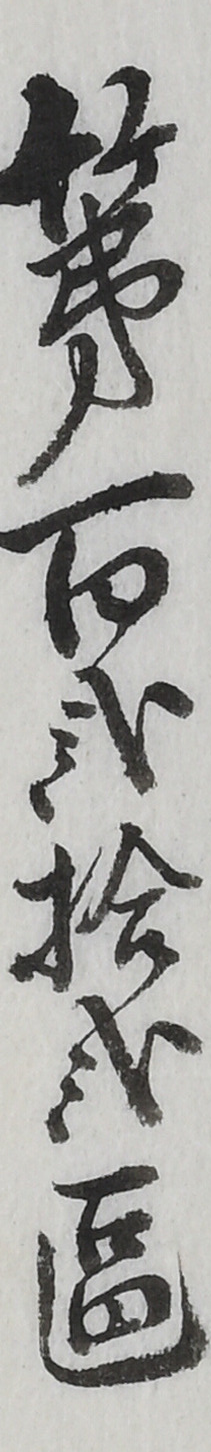第百弐拾弐区
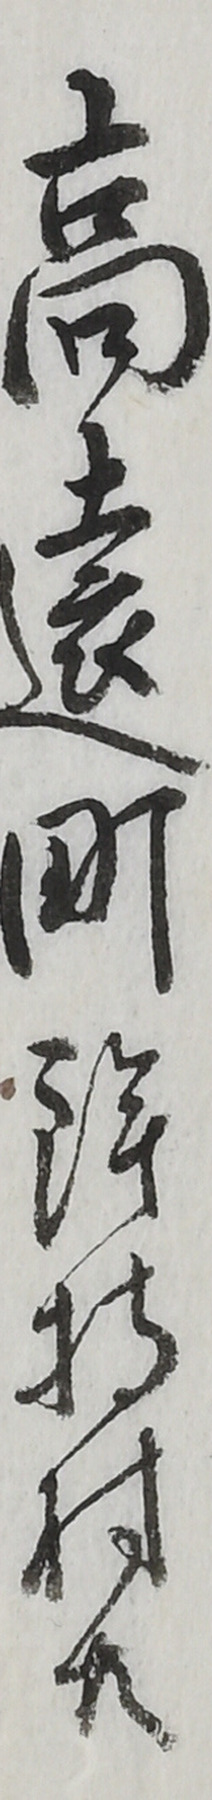高遠町鉾持村共
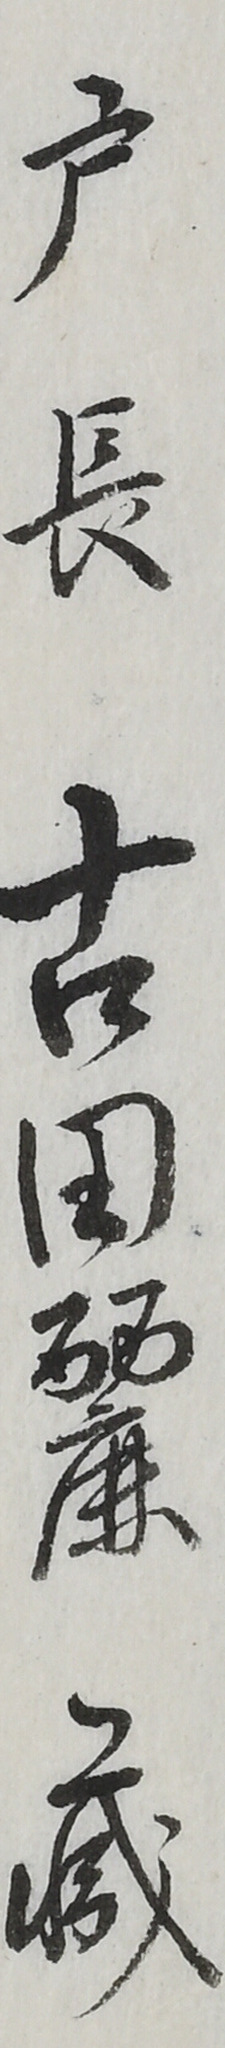戸長古田麗蔵
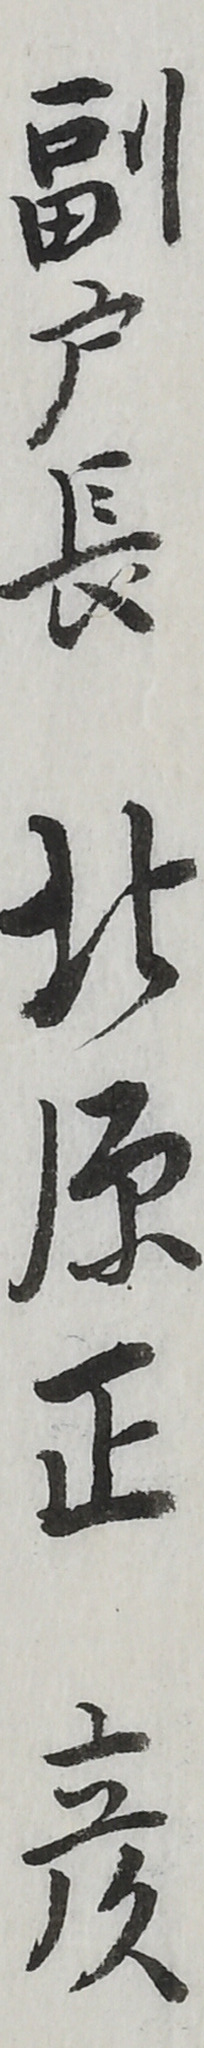副戸長北原正彦
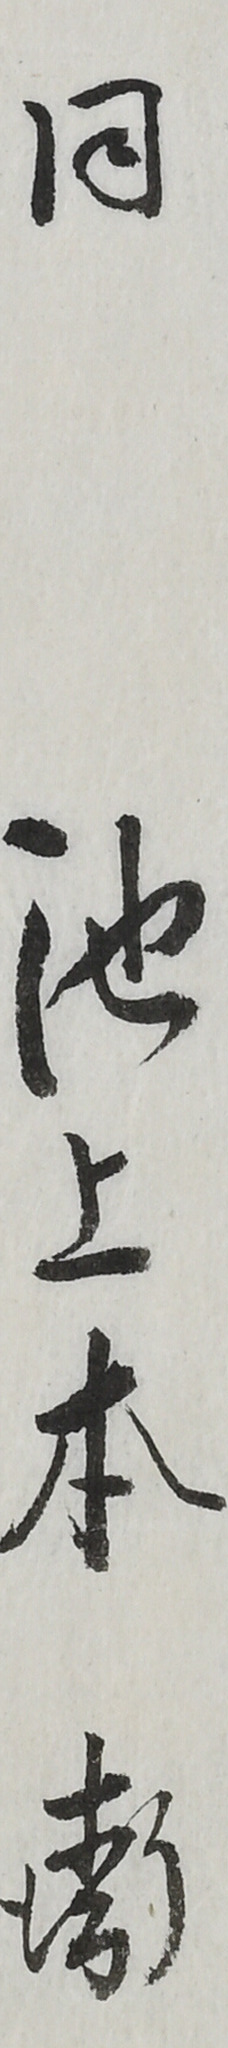同池上本衛
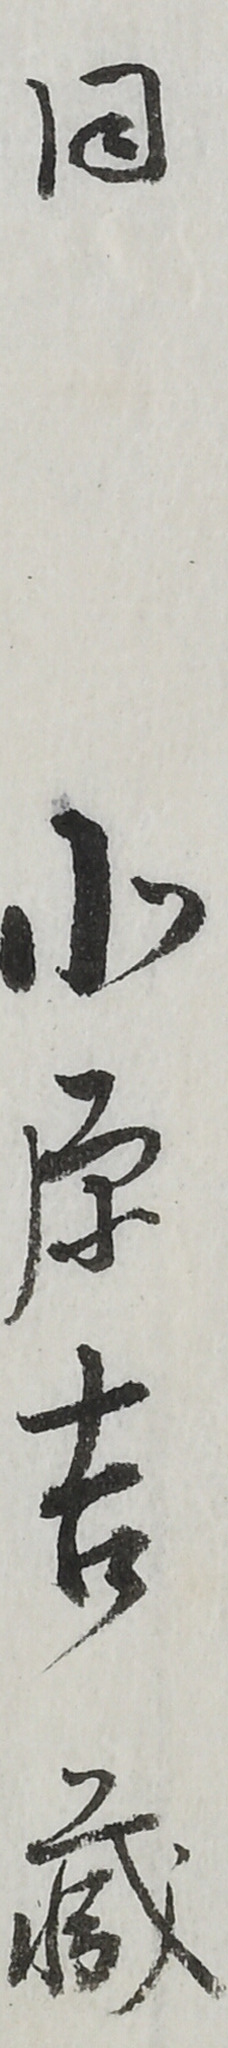同北原吉蔵
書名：伊那郡毎村戸長副戸長名簿
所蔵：伊那市立高遠町図書館・合同会社AMANE
